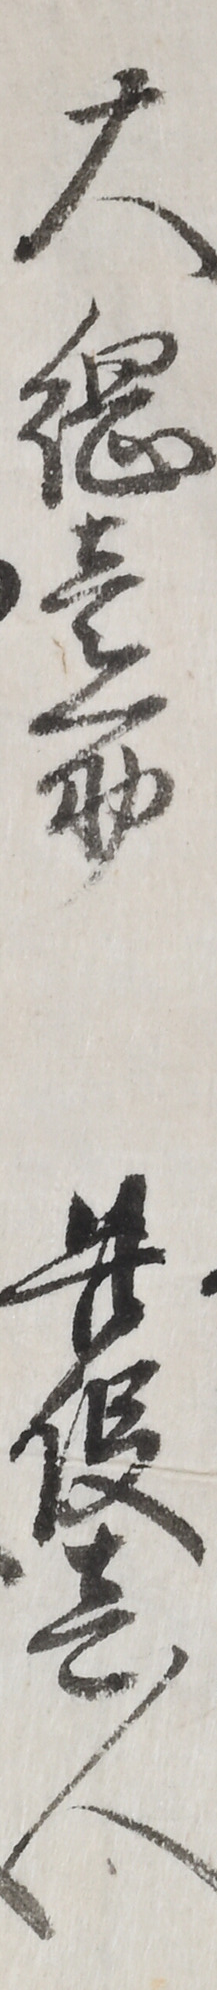大綱壱筋此役壱人
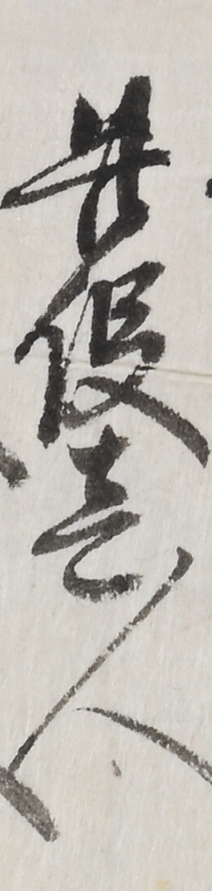此役壱人
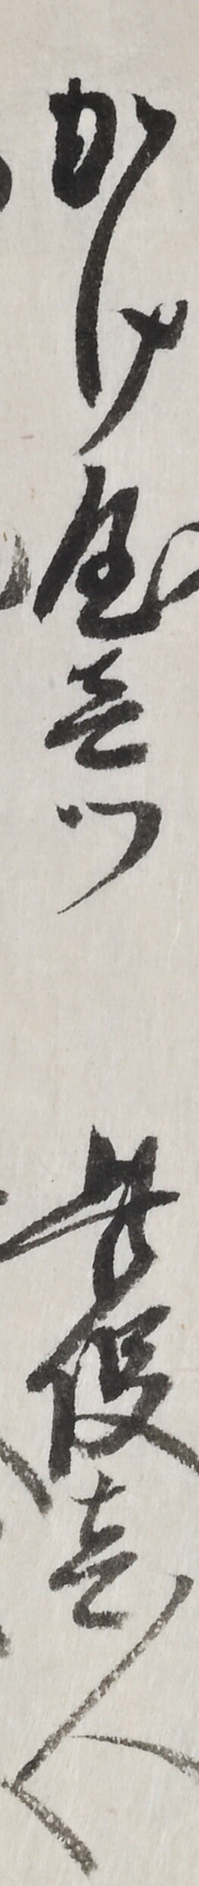かけ屋壱つ此役壱人
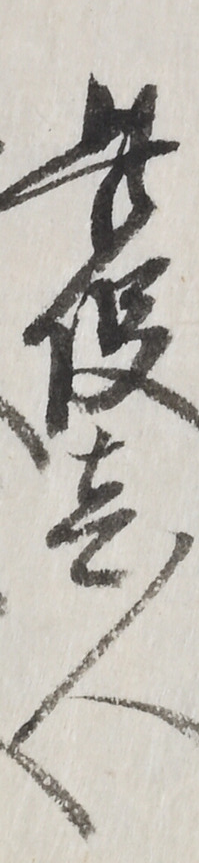此役壱人
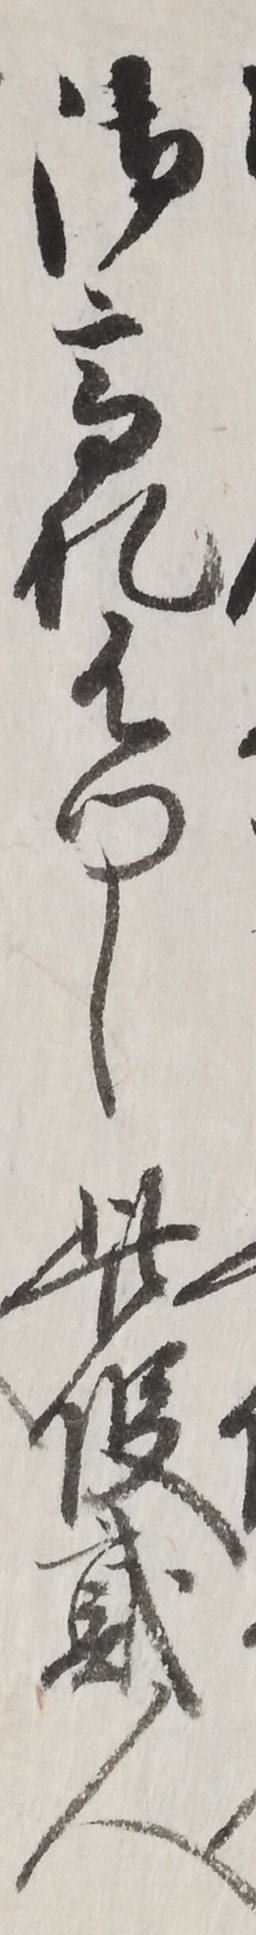御高札はつし此役壱人
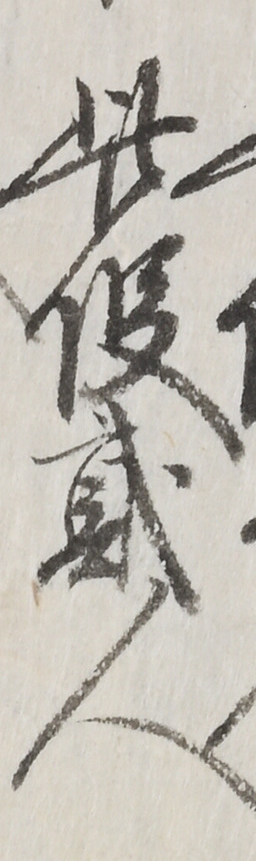此役壱人
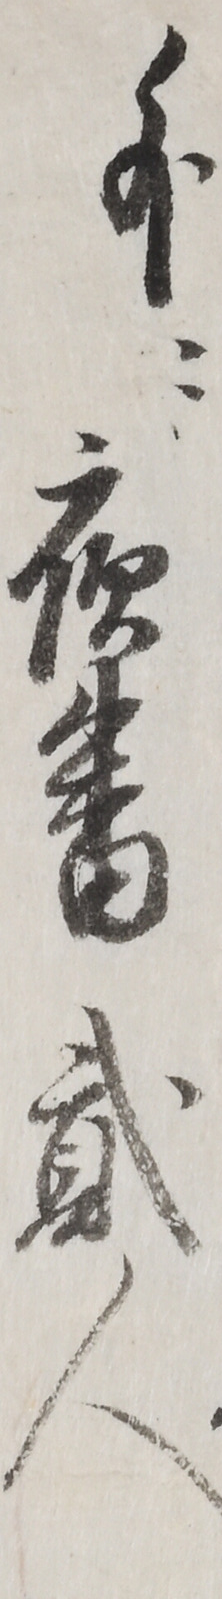外ニ夜番弐人
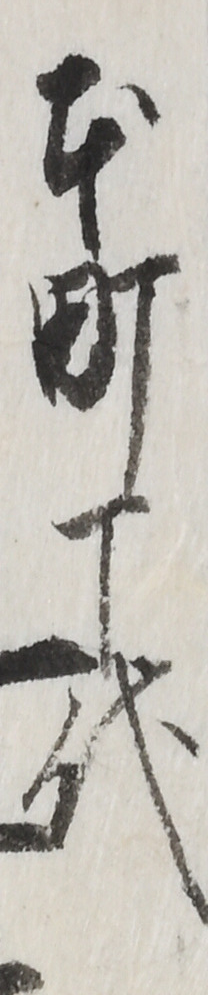本町丁代
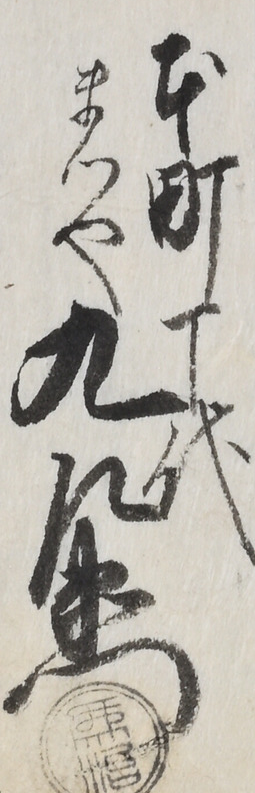まつや九左衛門㊞

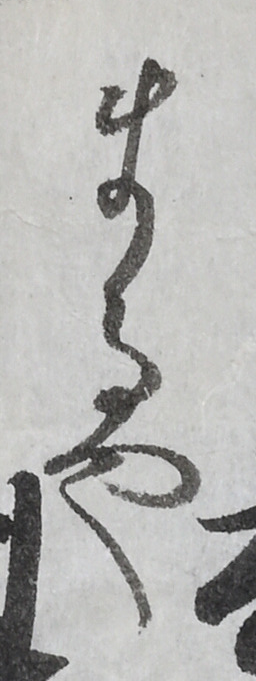まるや
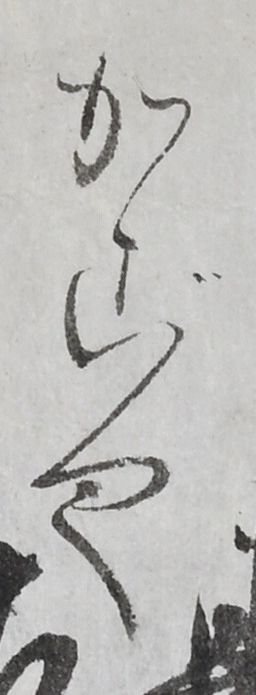かすや
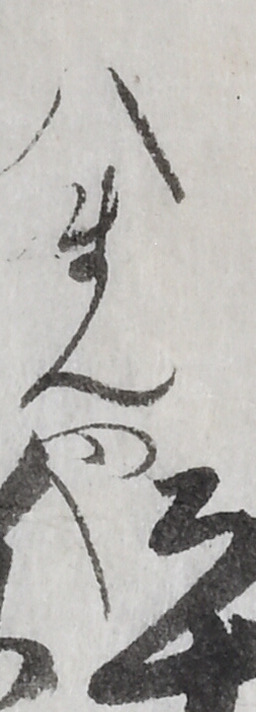八まんや
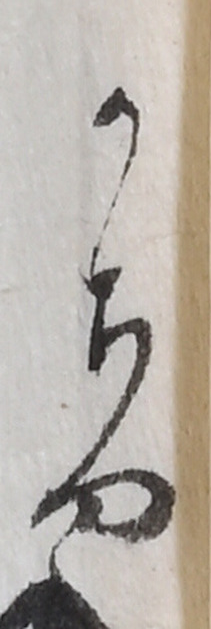かちや
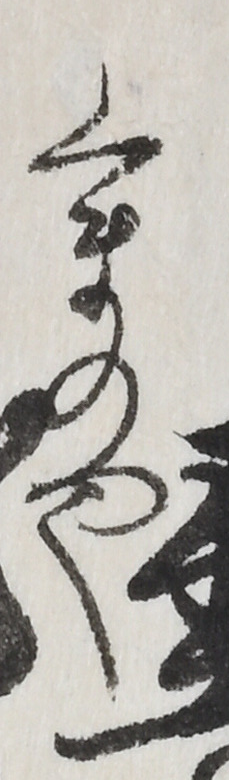くまのや
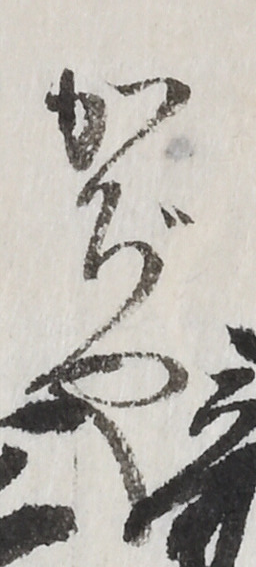かぢや
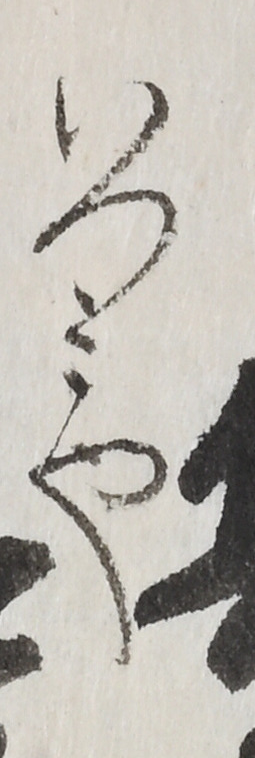いつミや
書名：當町火消道具幷役付帳
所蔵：伊那市立高遠町図書館・合同会社AMANE
